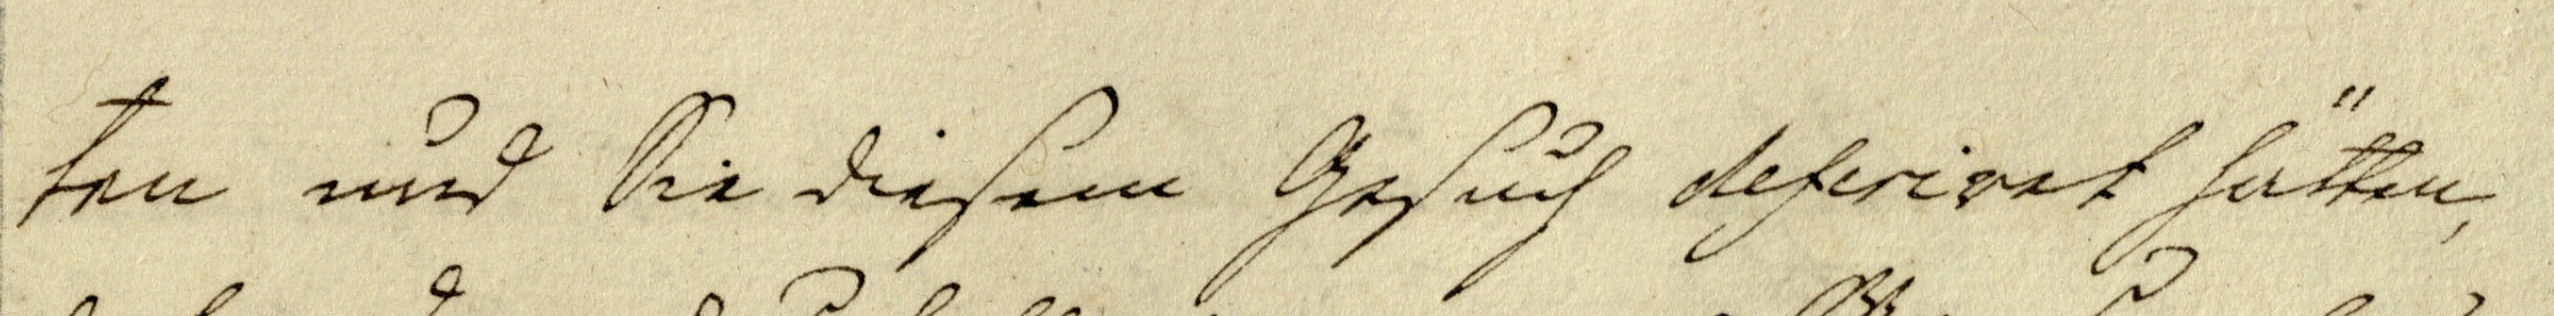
ten und Sie diesem Gesuch deferiret hätten,
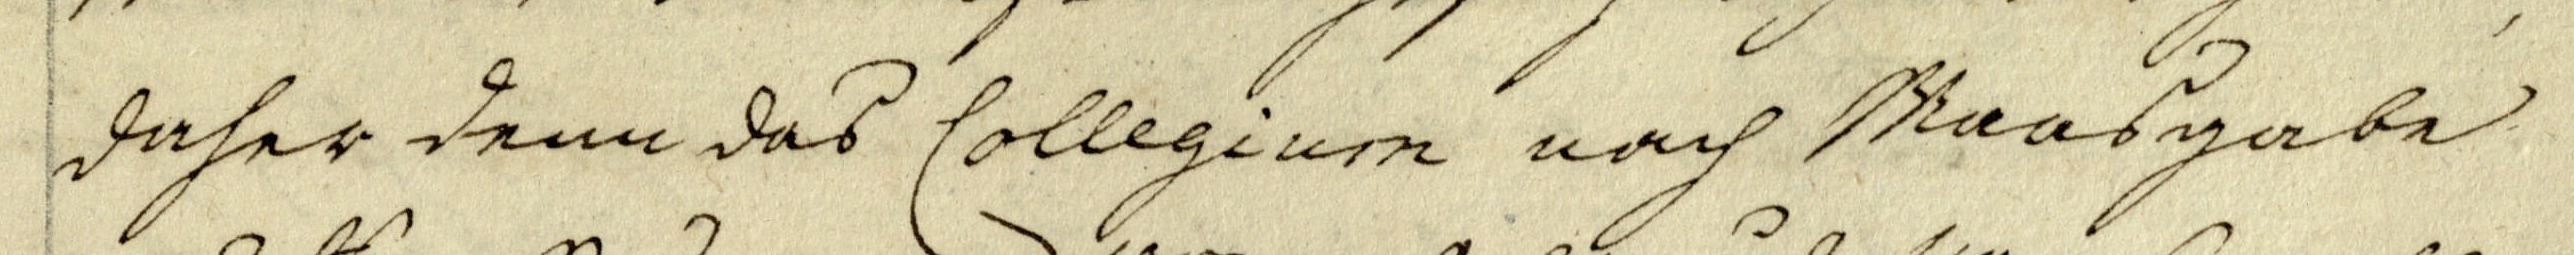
daher denn das Collegium nach Maasgabe
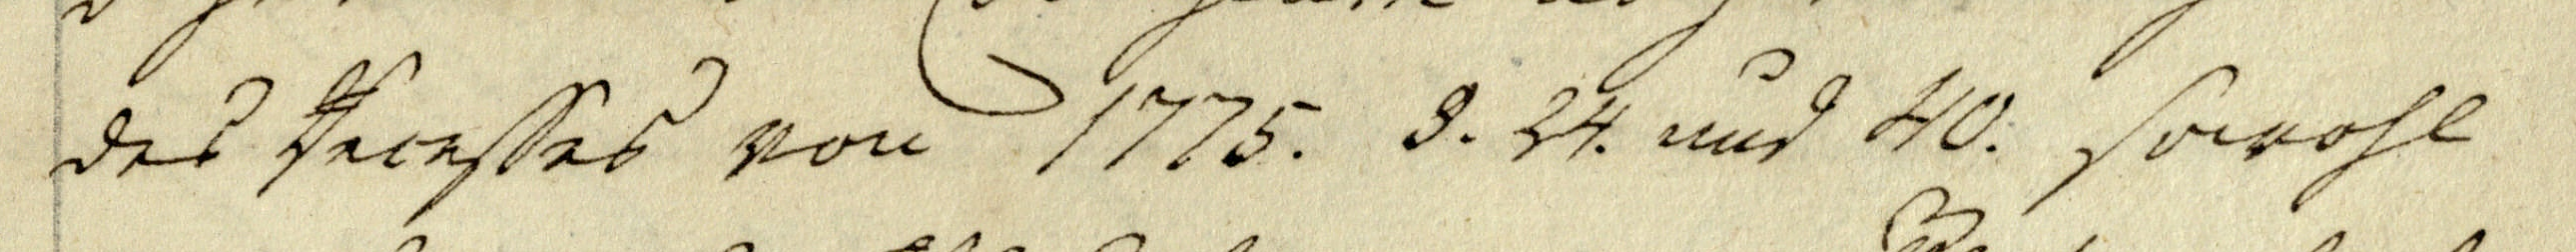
des Recesses von 1775. §. 24. und 40. sowohl
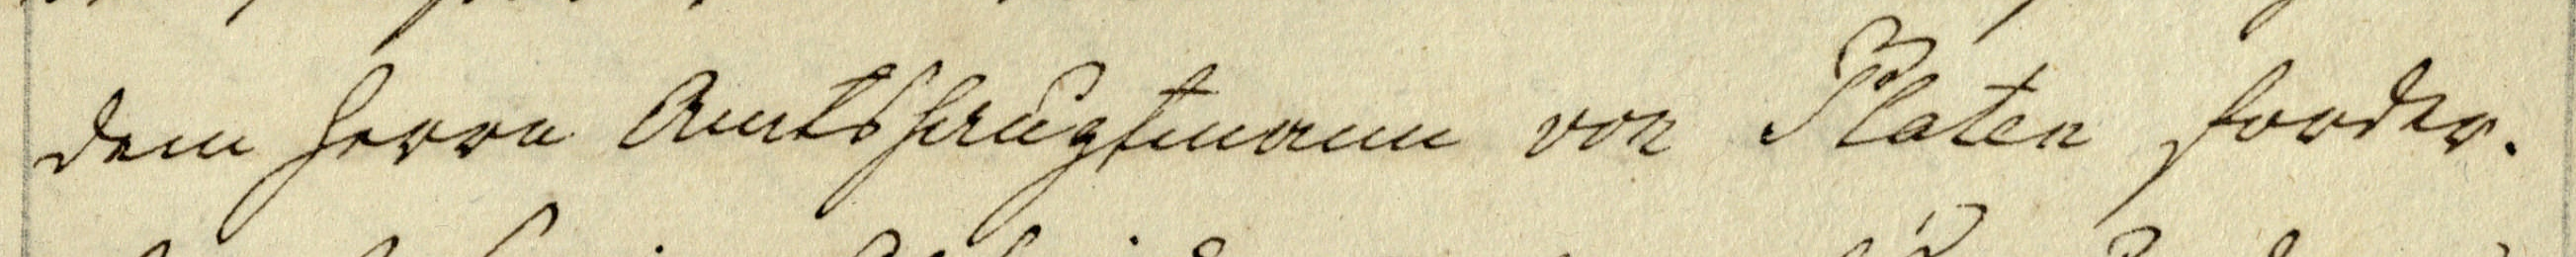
dem Herrn Amtshauptmann von Platen forder¬
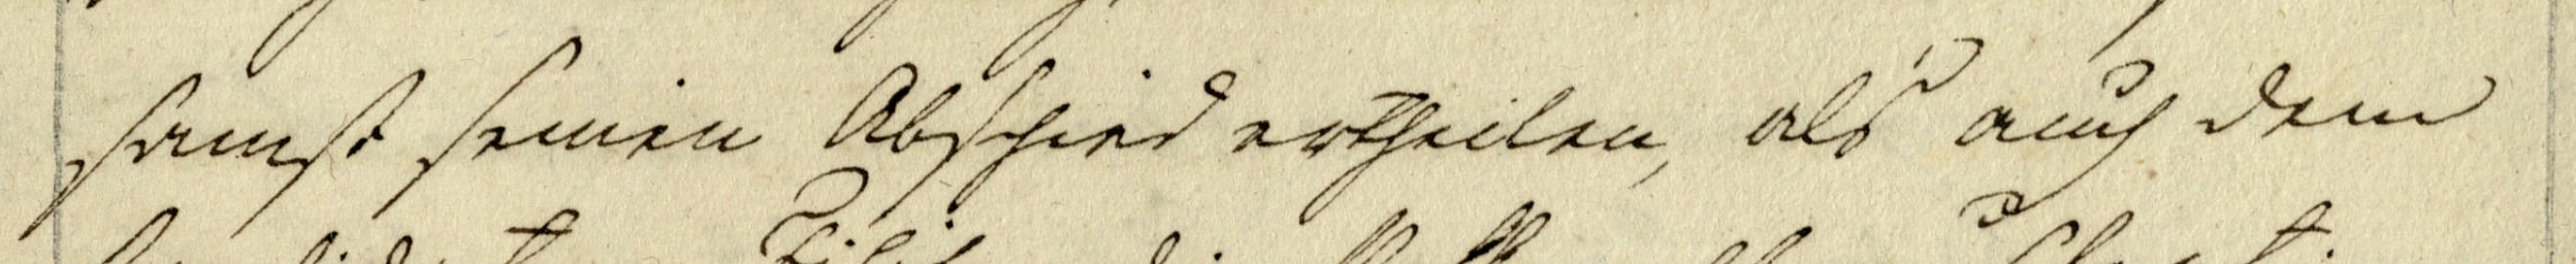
samst seinen Abschied ertheilen, als auch dem
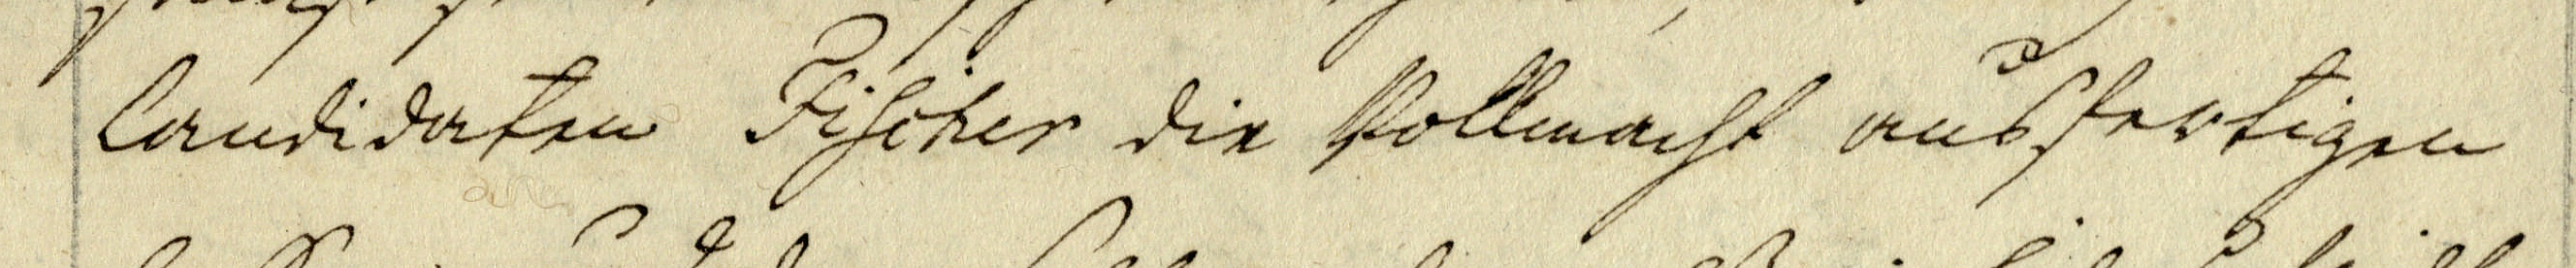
Candidaten Fischer die Vollmacht ausfertigen
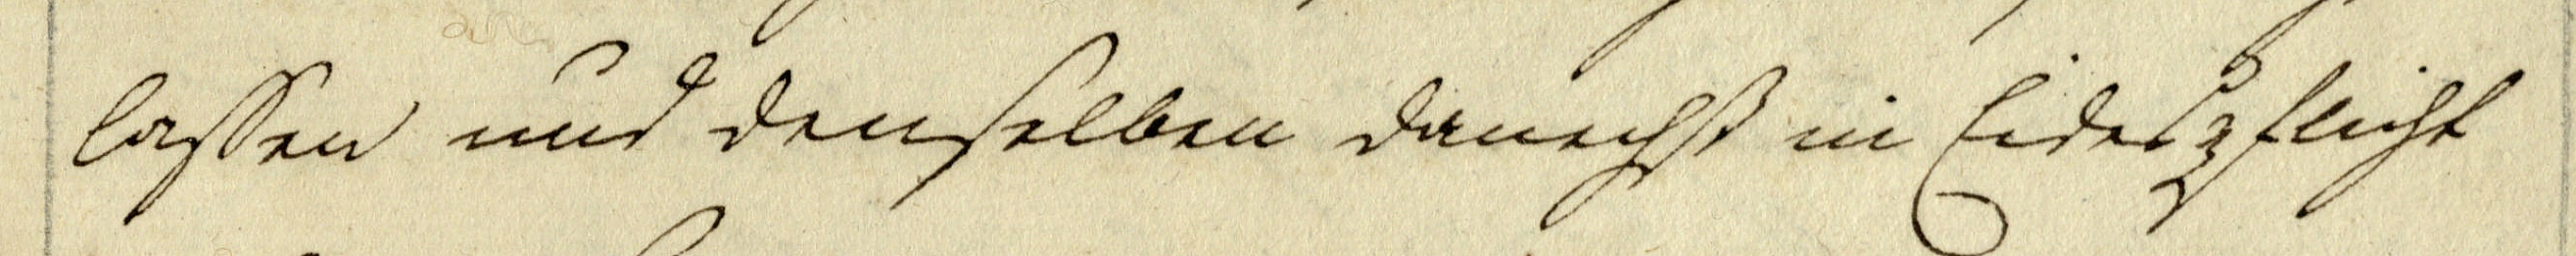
lassen und denselben danechst in Eidespflicht
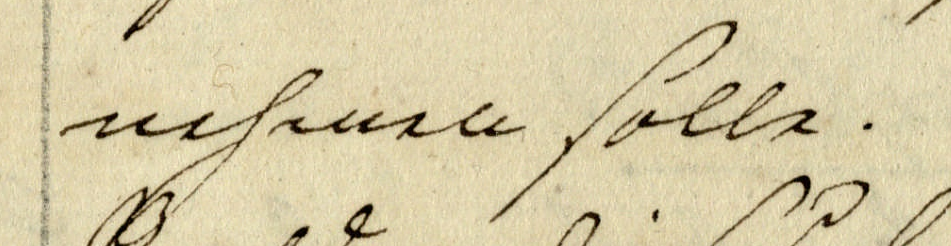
nehmen solle.
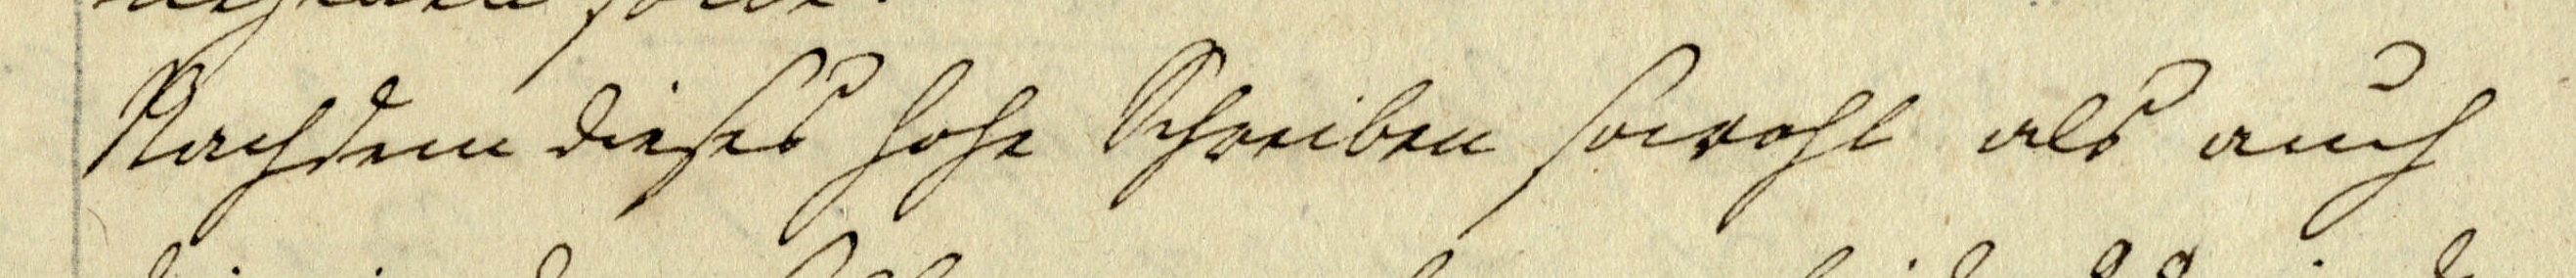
Nachdem dieses hohe Schreiben sowohl als auch
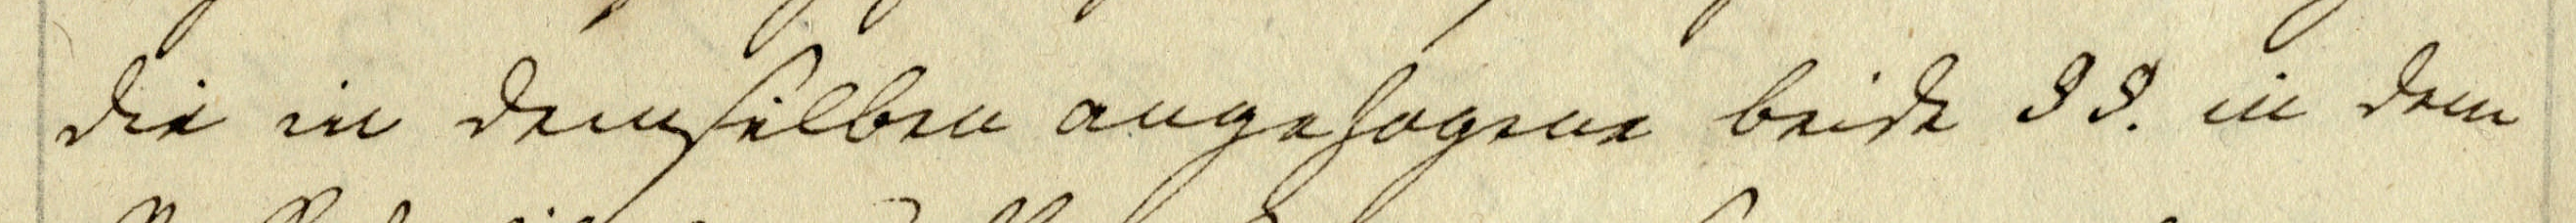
die in demselben angezogene beide § §. in dem
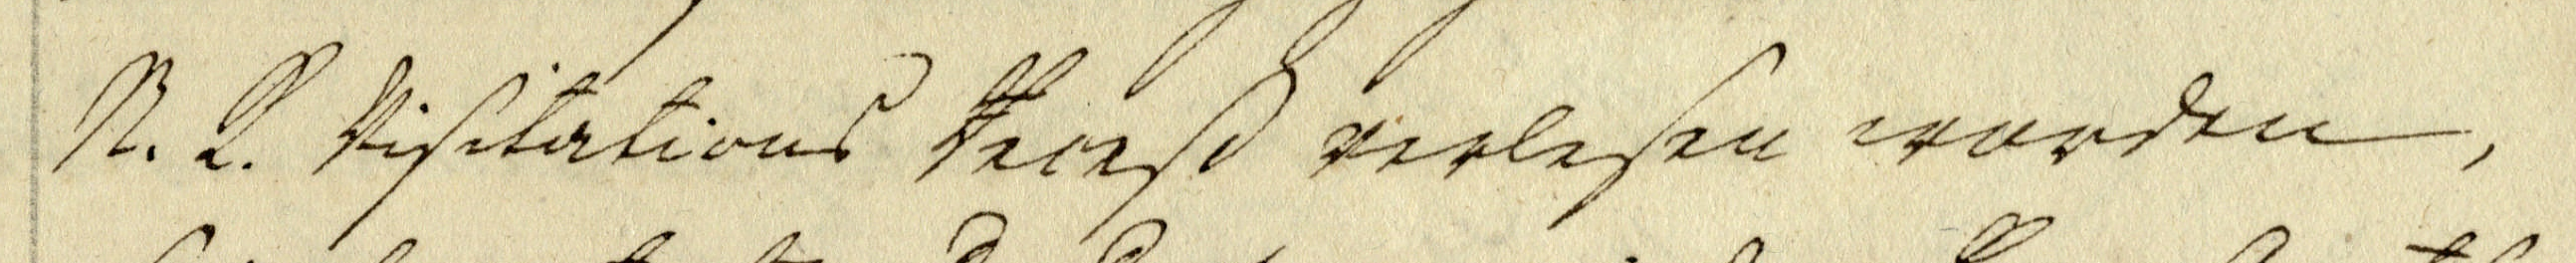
N. K. Visitations Receß verlesen wurden,
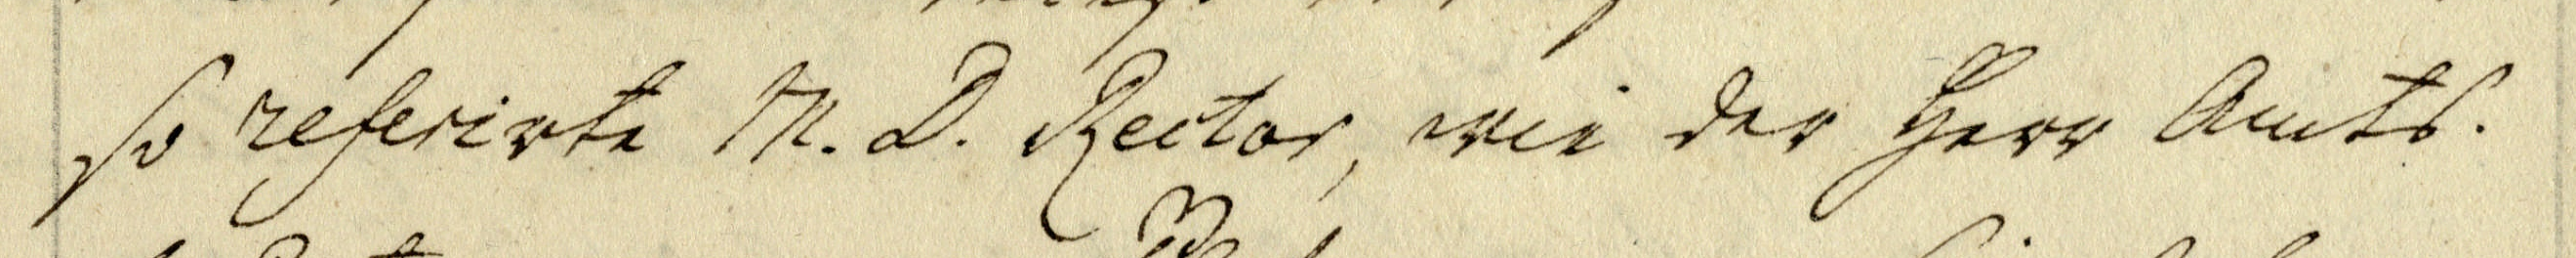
so referirte M. D. Rector, wie der Herr Amts¬
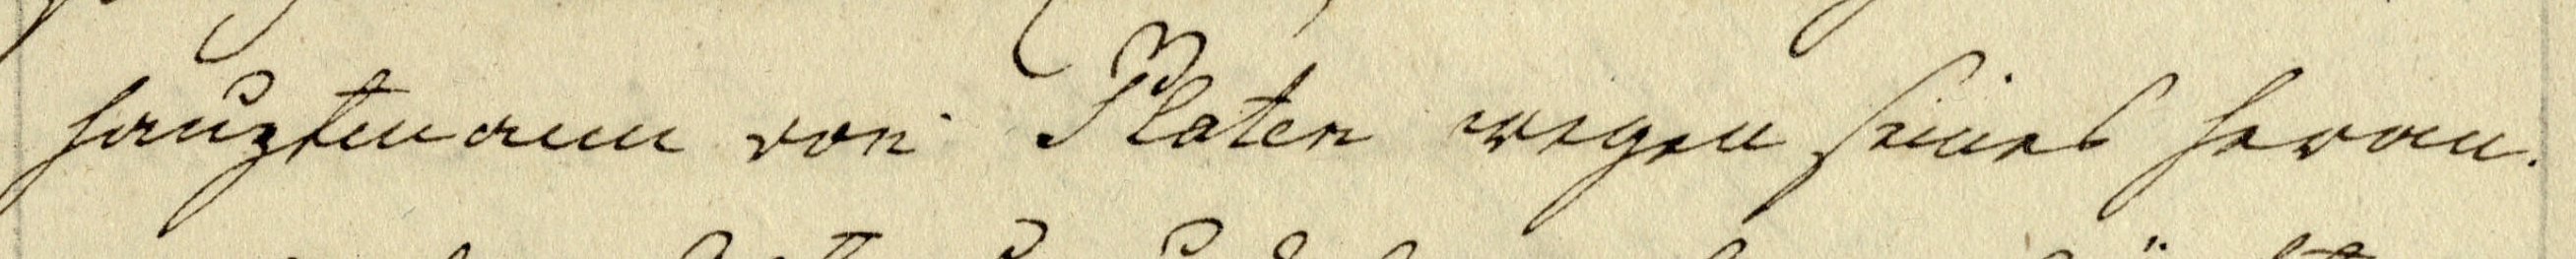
Hauptmann von Platen wegen seines heran¬
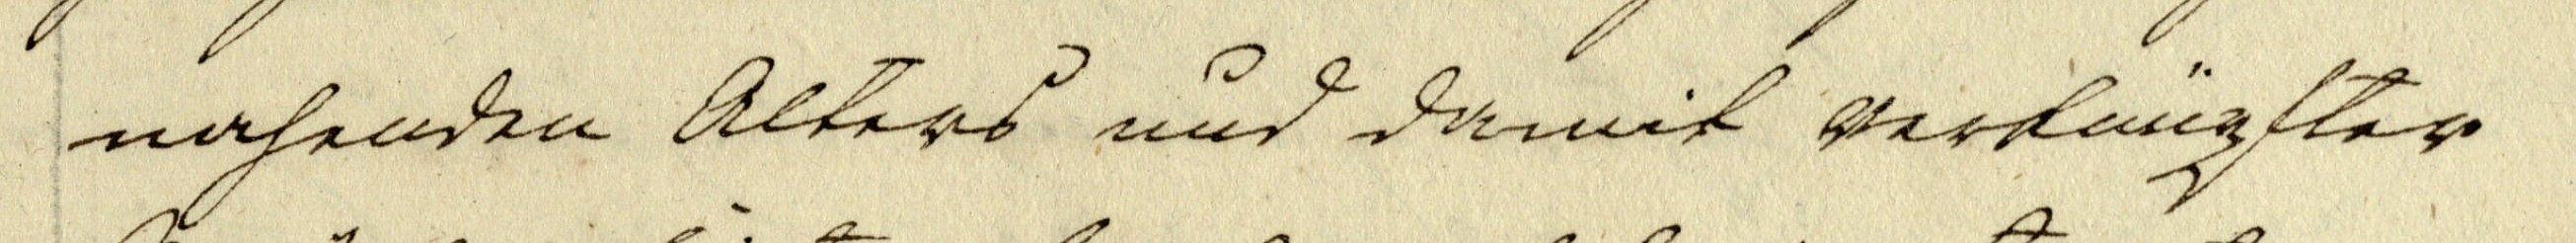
nahenden Alters und damit verknüpfter
